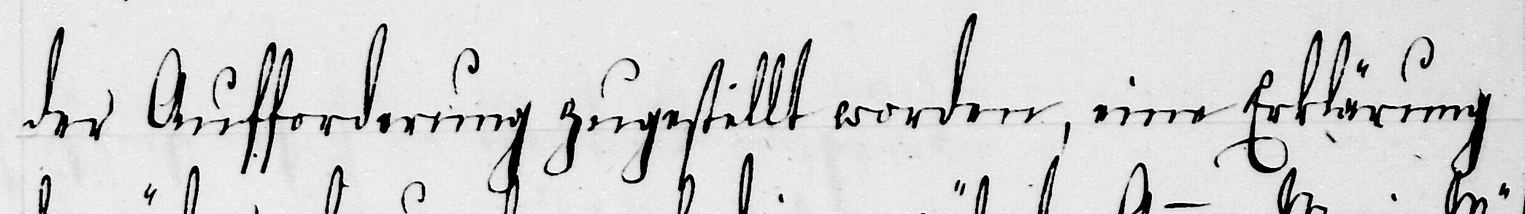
der Aufforderung zugestellt worden, eine Erklärung
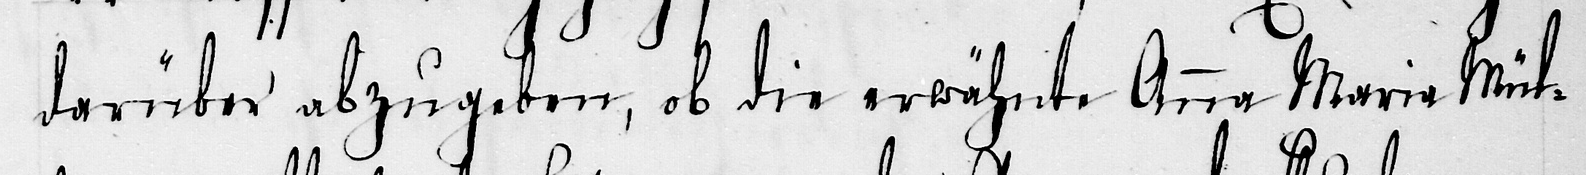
darüber abzugeben, ob die erwähnte Anna Maria Mül¬
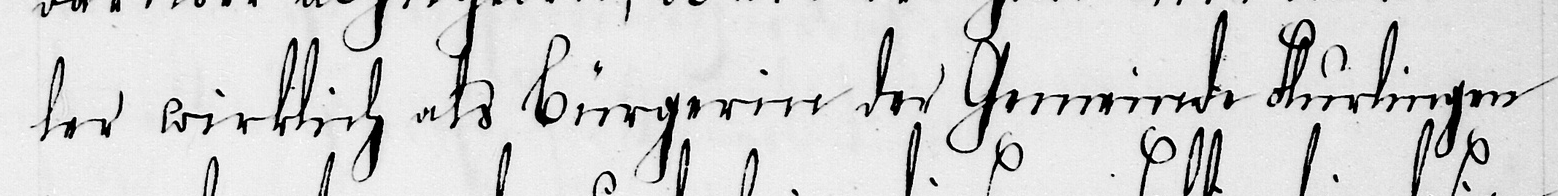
ler wirklich als Bürgerin der Gemeinde Flurlingen
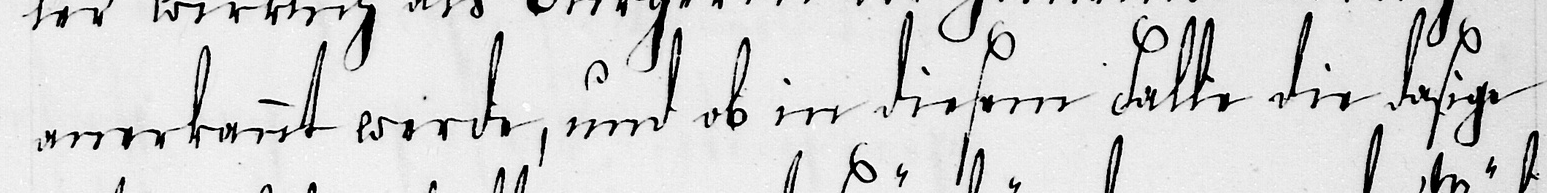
anerkannt werde, und ob in diesem Falle die dasige
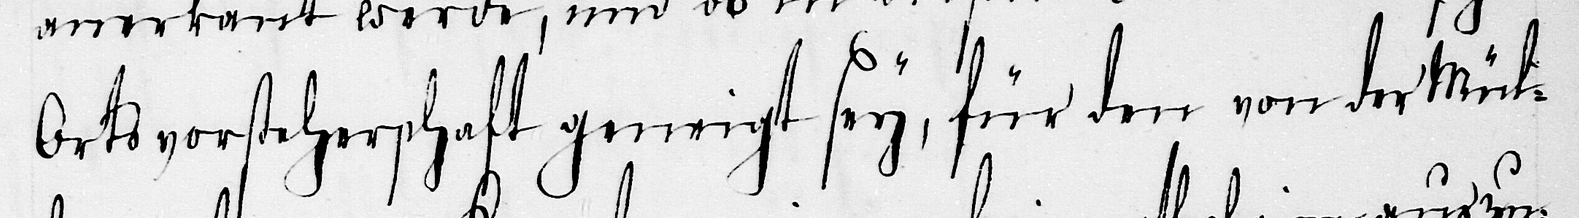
Ortsvorsteherschaft geneigt sey, für den von der Mül¬
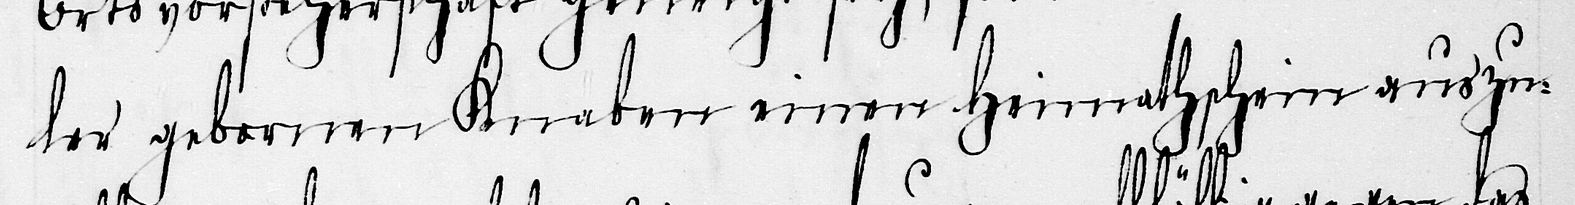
ler gebornen Knaben einen Heimathschein auszu¬
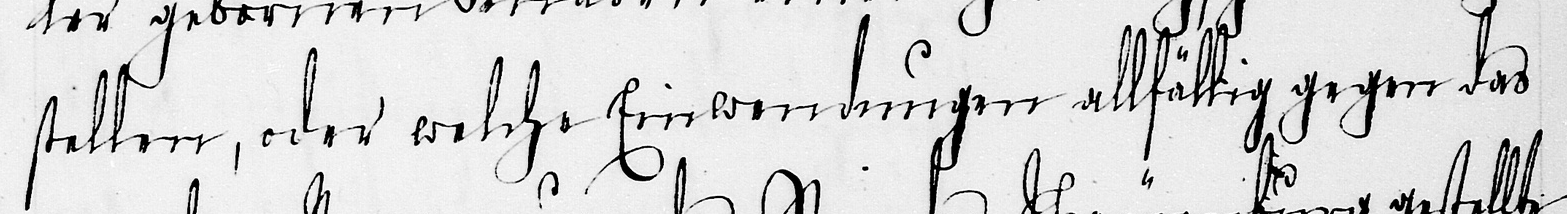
stellen, oder welche Einwendungen allfällig gegen das
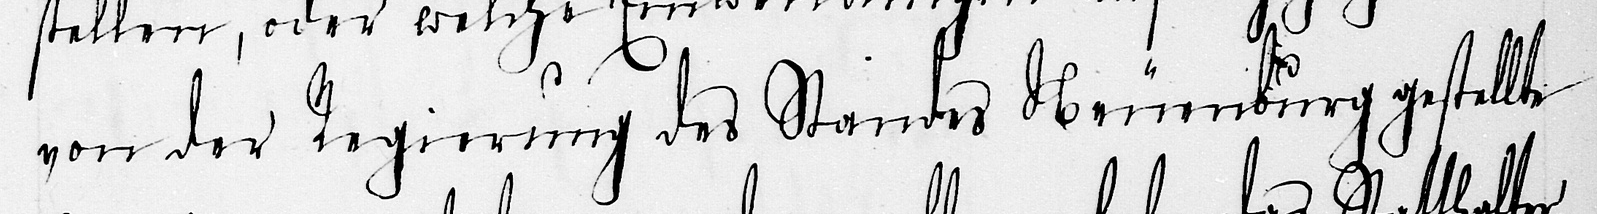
von der Regierung des Standes Neuenburg gestellte
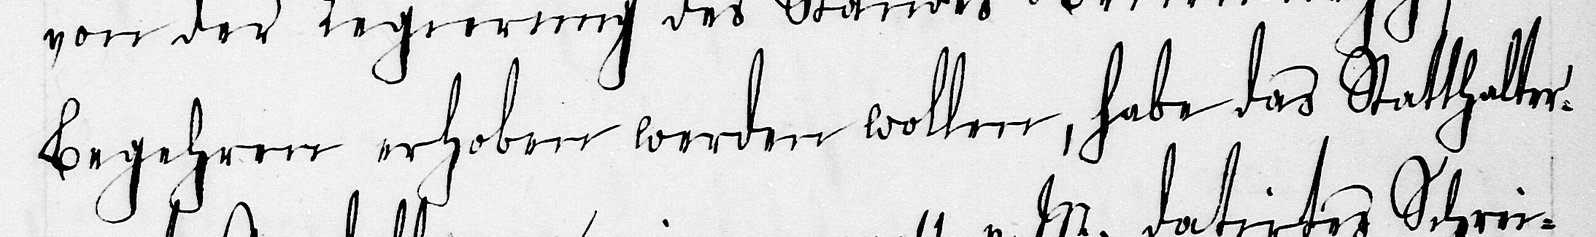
Begehren erhoben werden wollen, habe das Statthalte¬
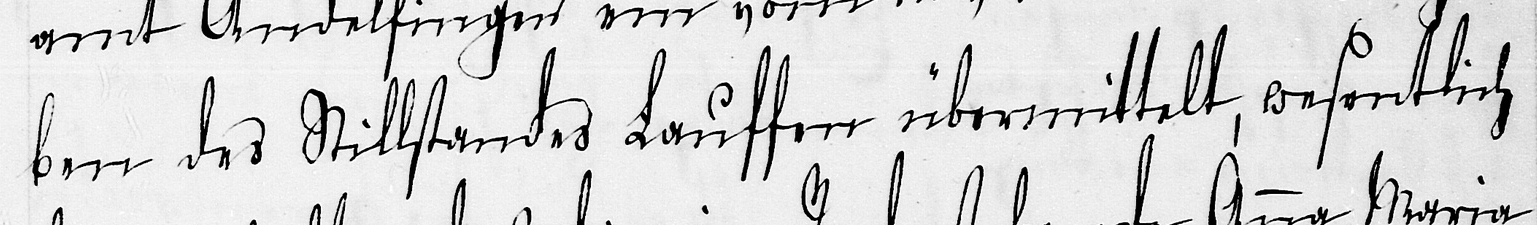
ben des Stillstandes Lauffen übermittelt, wesentlich
